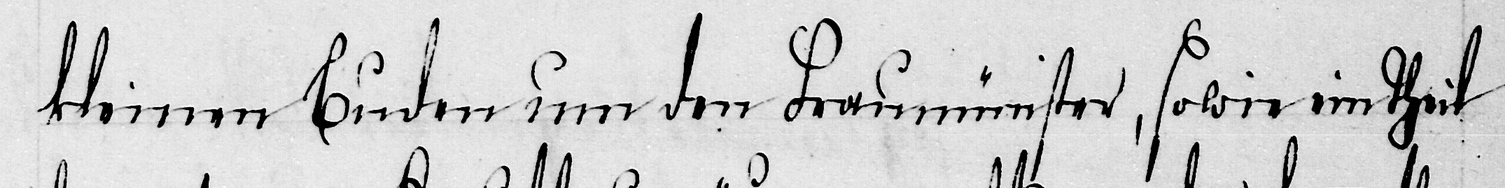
kleinen Buden um den Fraumünster, sowie ein Theil
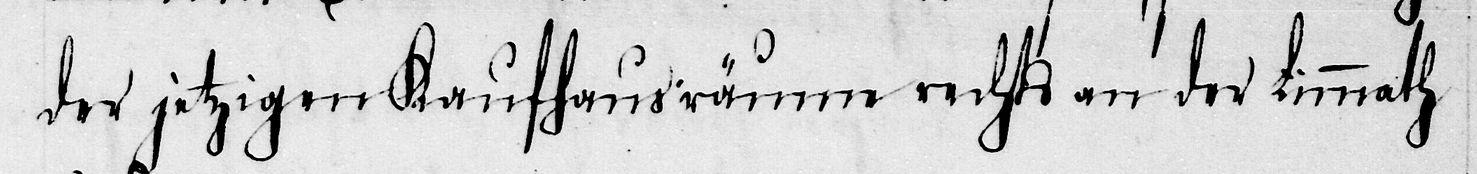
der jetzigen Kaufhausräume rechts an der Limmath
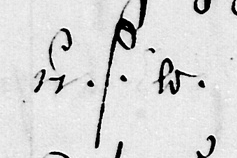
u. s. w.
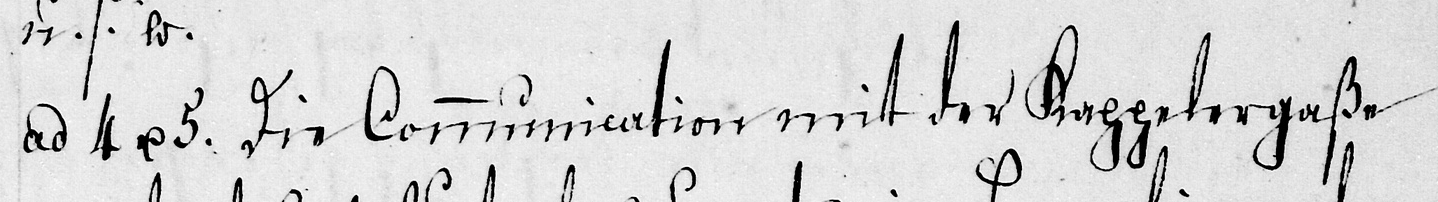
u. 5. Die Communication mit der Kappelergaße
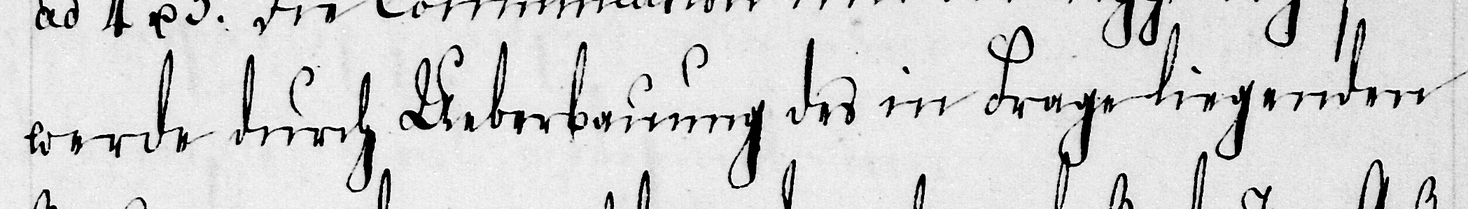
werde durch Ueberbauung des in Frage liegenden
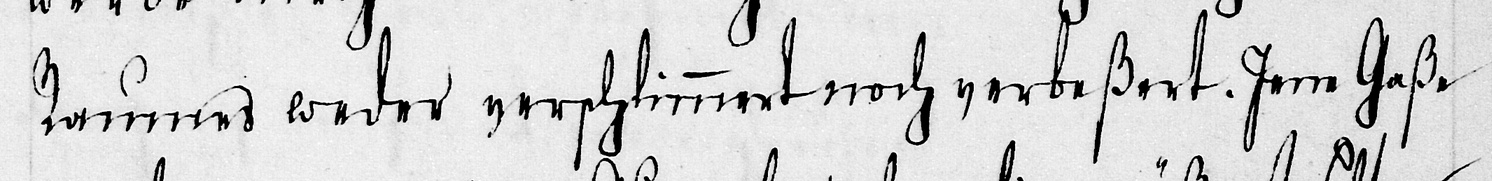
Raumes weder verschlimmert noch verbeßert. Jene Gaße
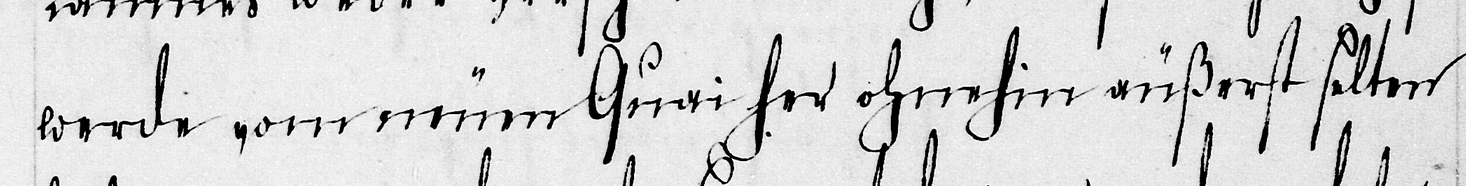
werde vom neuen Quai her ohnehin äußerst selten
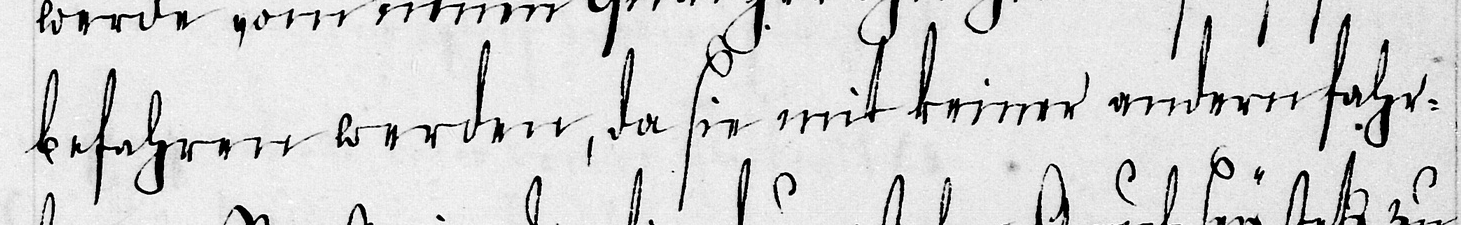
befahren werden, da sie mit keiner andern fahr¬
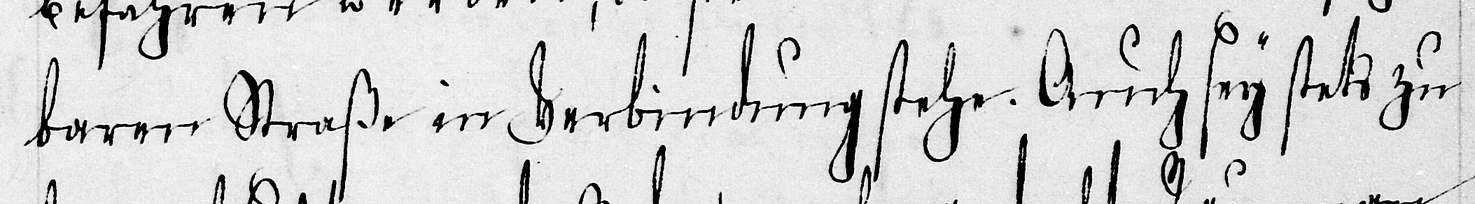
baren Straße in Verbindung stehe. Auch sey stets zu
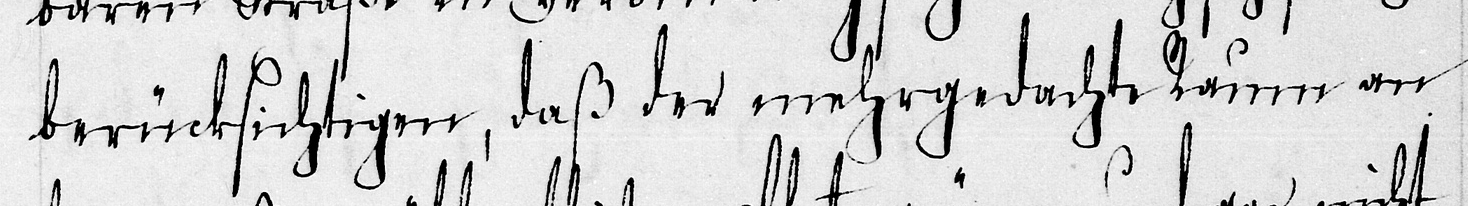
berücksichtigen, daß der mehrgedachte Raum an
